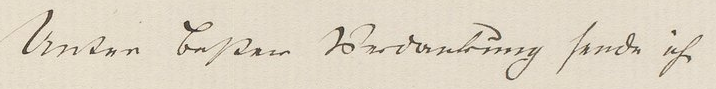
Unter bester Verdankung sende ich
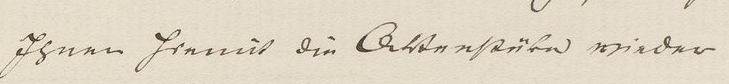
Ihnen hiemit die Aktenstüke wieder
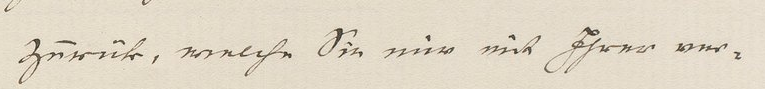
zurück, welche Sie mir mit Ihrer ver-
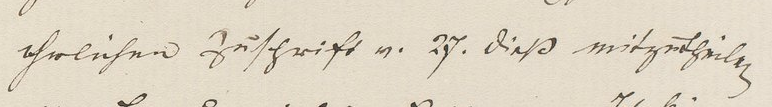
ehrlichen Zuschrift v. 27. dieß mitzutheilen
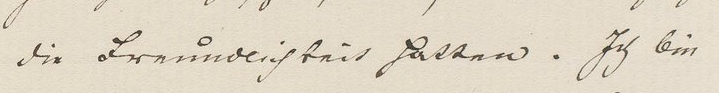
die Freundlichkeit hatten. Ich bin
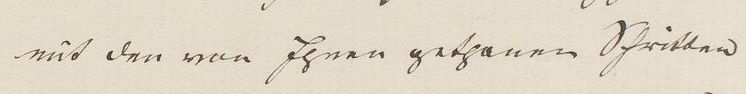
mit den von Ihnen gethanen Schriften
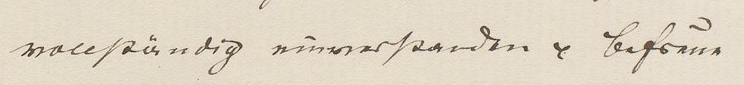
vollständig einverstanden & befreue
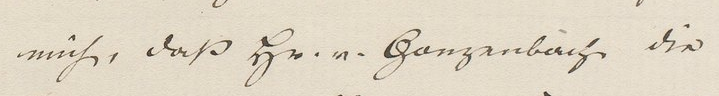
mich, daß Hr. v. Gonzenbach die
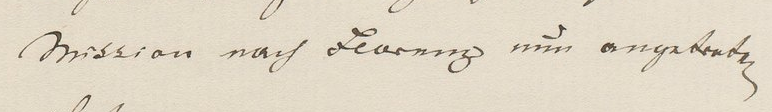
Mission nach Florenz nun angetreten
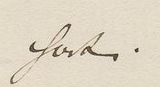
hat.
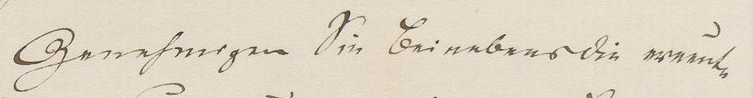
Genehmigen Sie beinebens die erneute
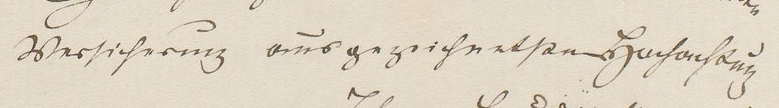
Versicherung ausgezeichnetster Hochachtung
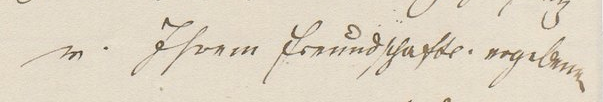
v. Ihrem freundschaftl. ergebenen
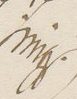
1871.
